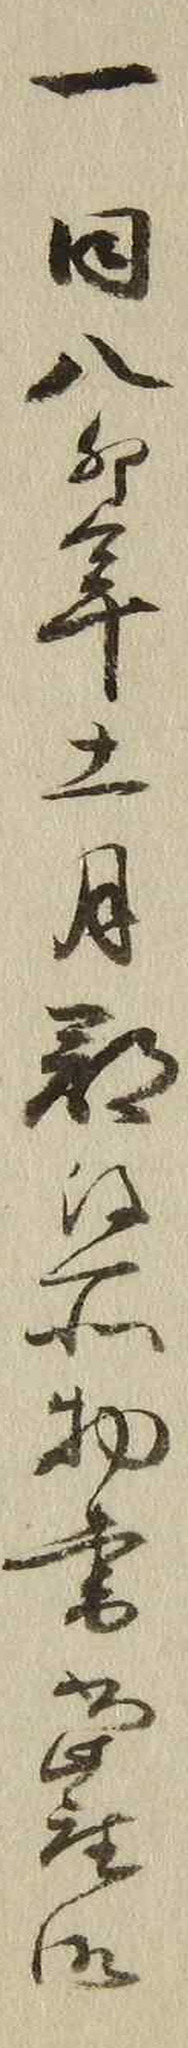一同八卯年十一月郡役所物書当座御
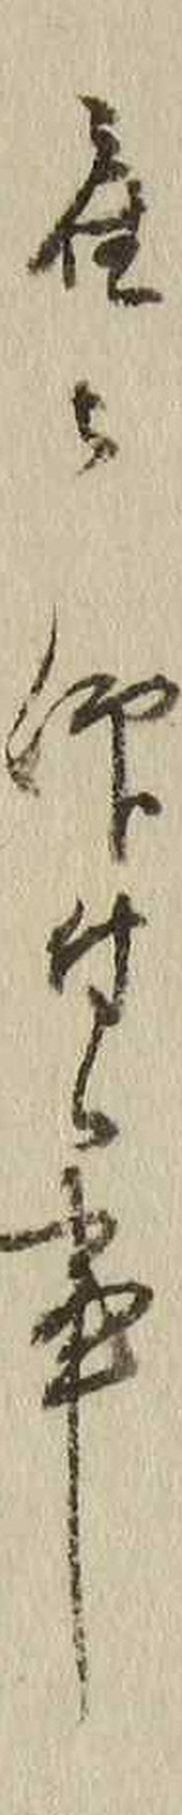雇被仰付候事
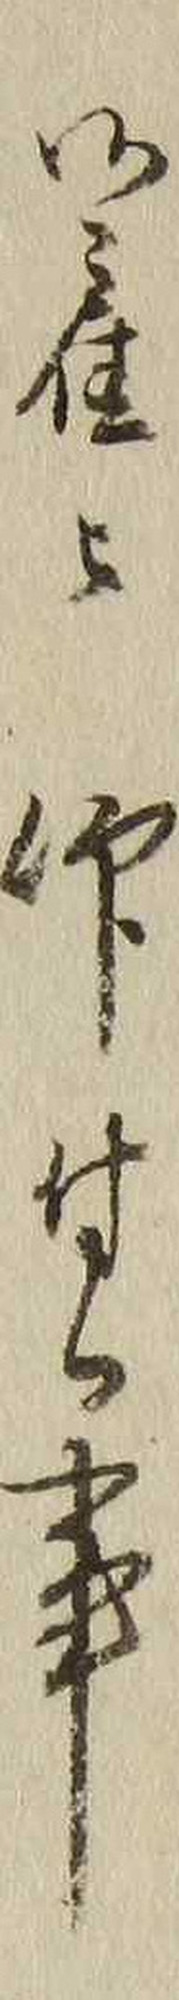御雇被仰付候事
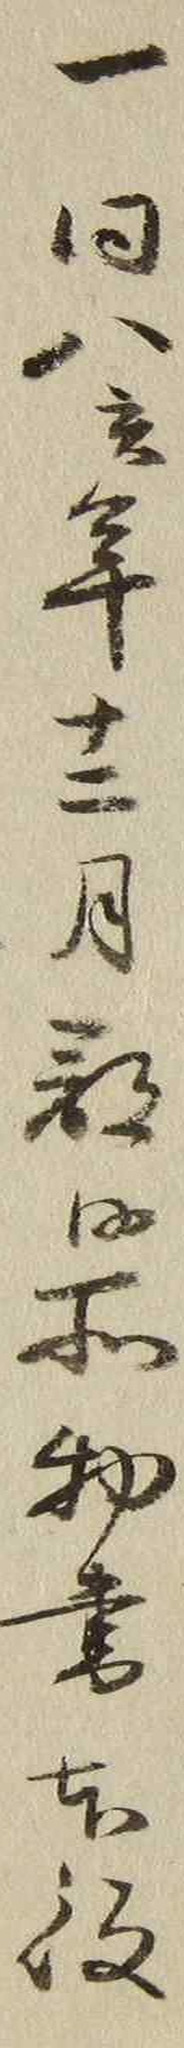一同八亥年十二月郡役所物書本役
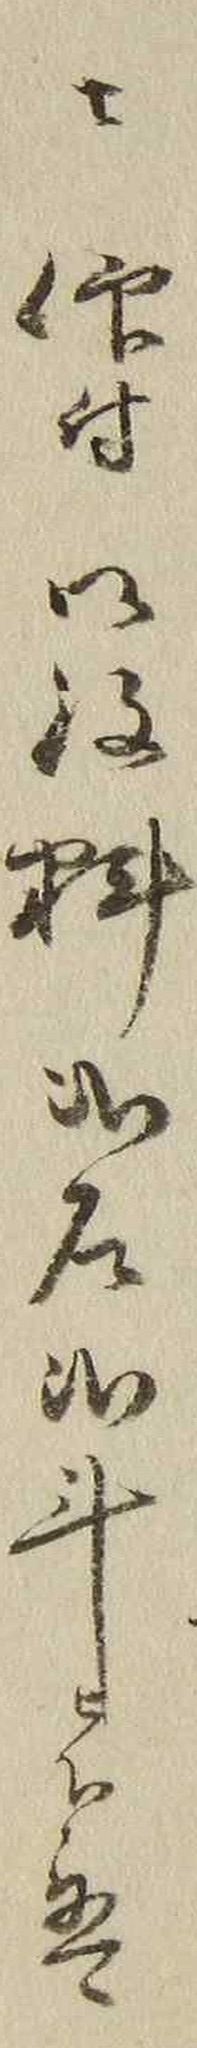被仰付御役料弐石弐斗被下置候
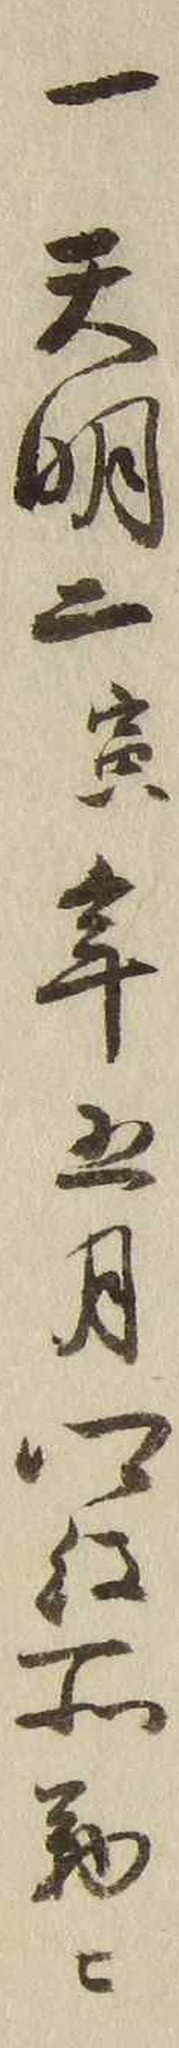一天明二寅年五月郷役所勤被

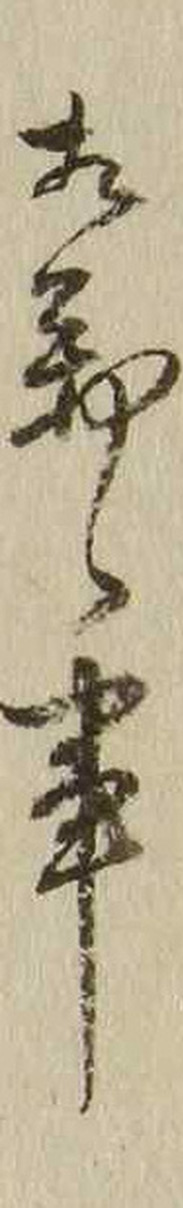相勤候事
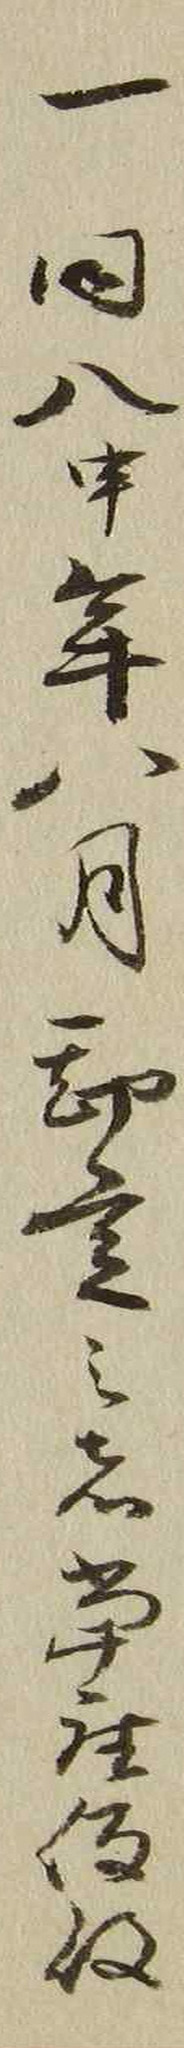一同八申年八月勘定之者当座仮役
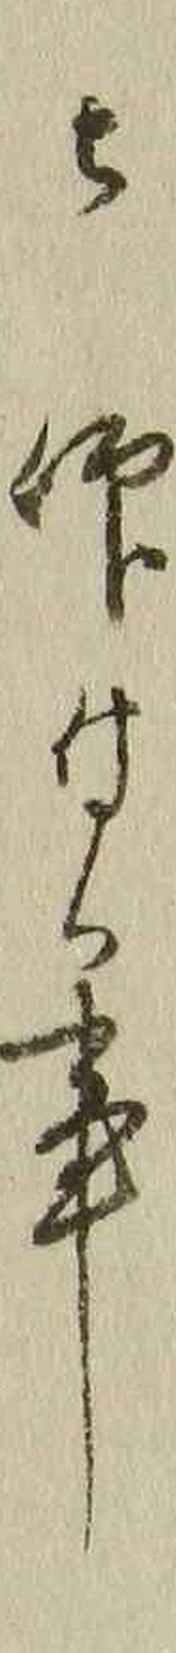被仰付候事
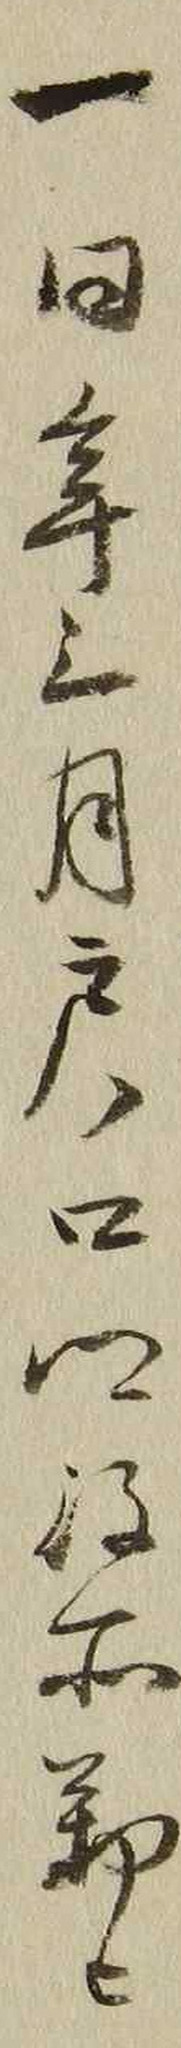一同年三月戸ノ口郷役所勤被
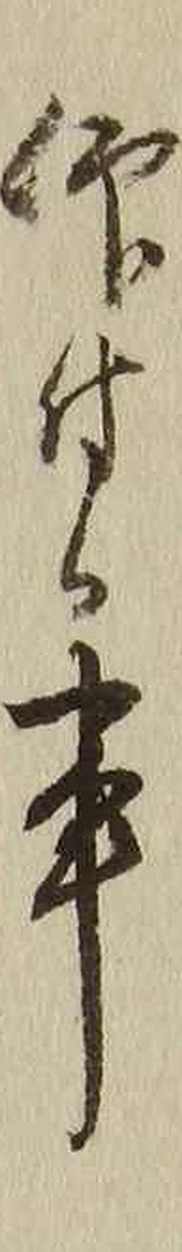仰付候事
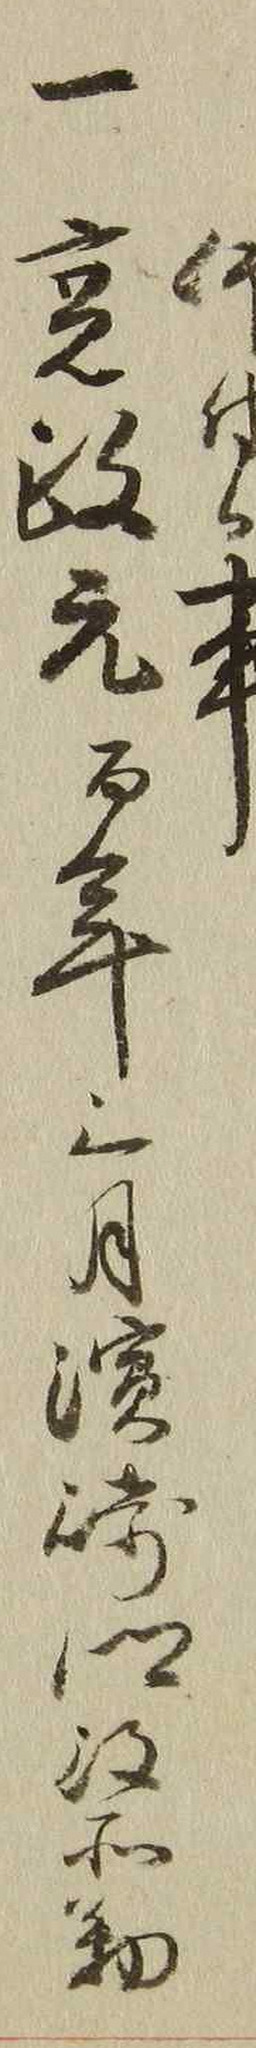一寛政元酉年三月浜崎郷役所勤
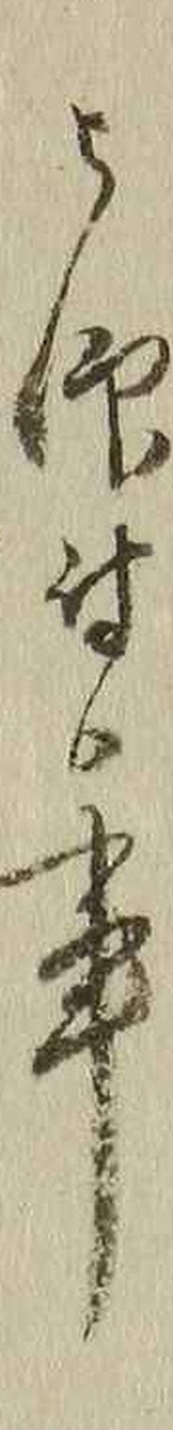被仰付候事
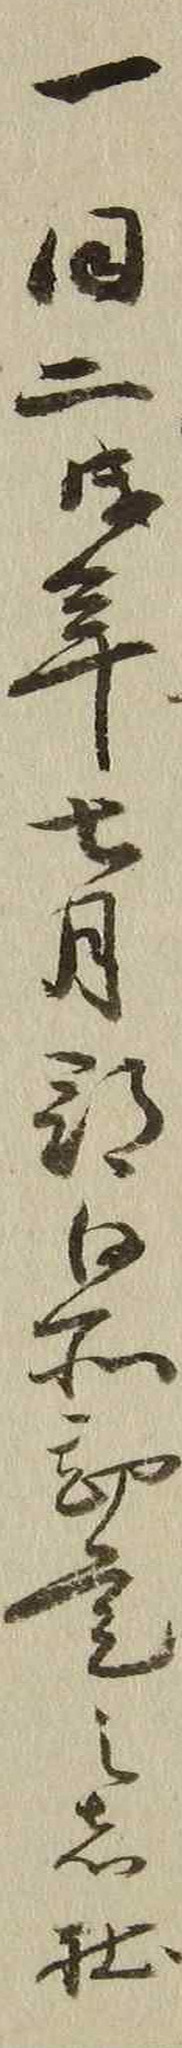一同二戌年七月郡役所勘定之者社
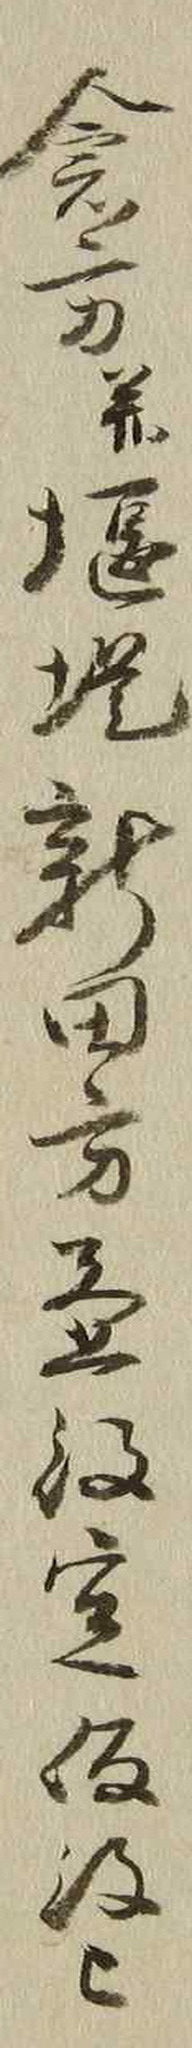倉方并堰堤新田方兼役定仮役被
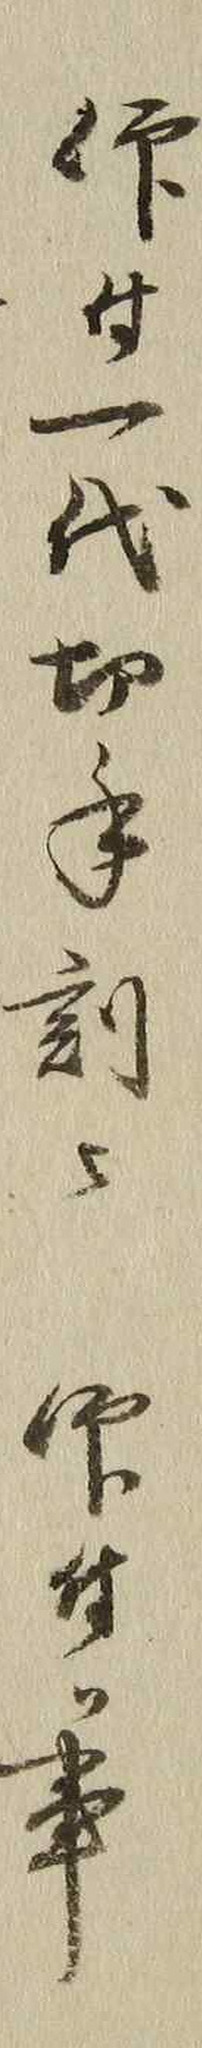仰付一代切手割被仰付候事
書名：諸士系譜　巻之236　ふ之部4
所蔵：会津若松市立会津図書館
